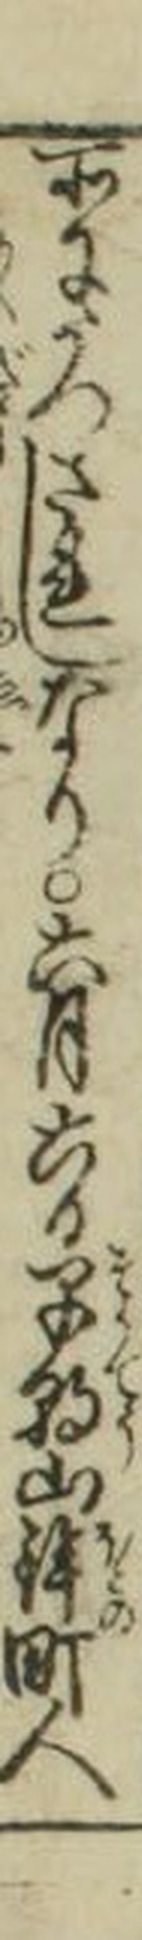所にうつされしなり。六月六日早朝山鉾町人
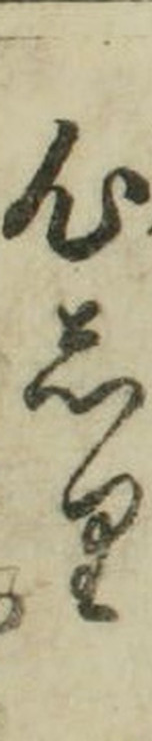心しり
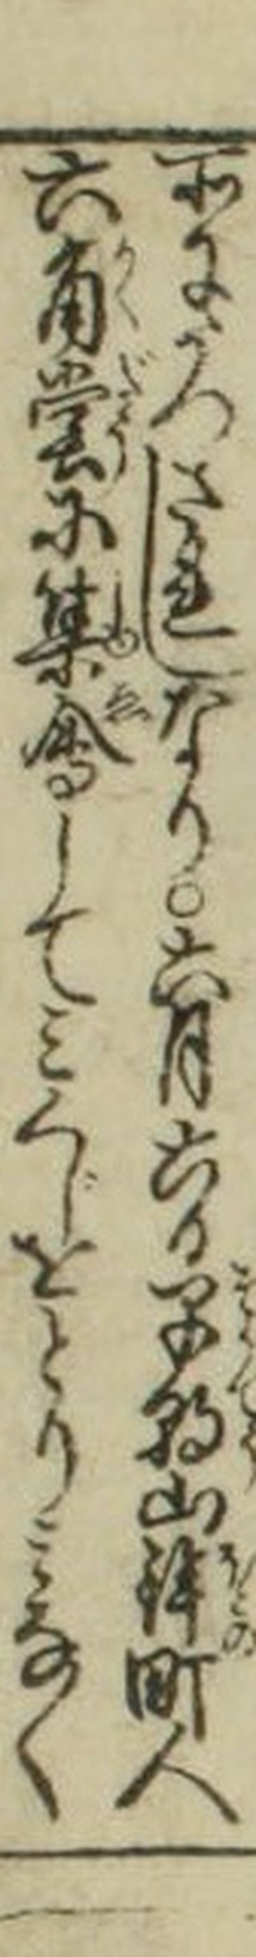六角堂に集会してミくじをとりミな〳〵
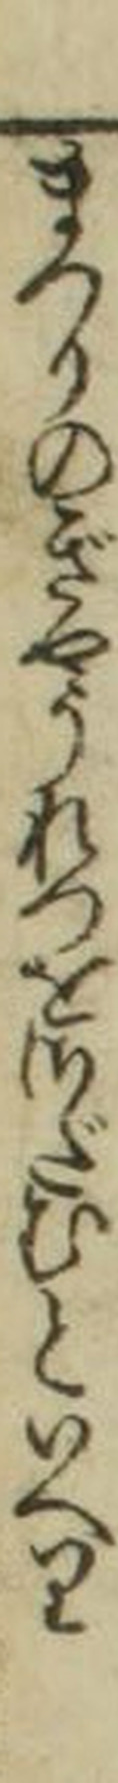まつりのぎやうれつをさだむといへり

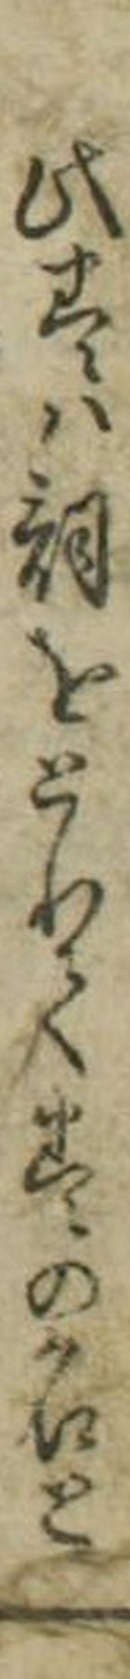此巻は詞をとりて巻の名と
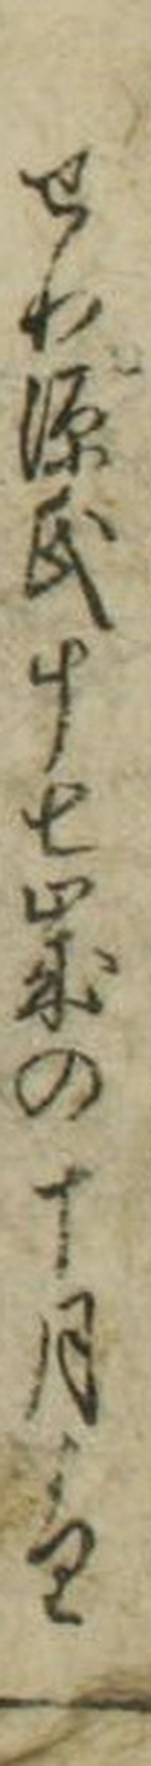せり。源氏十七歳の十月より
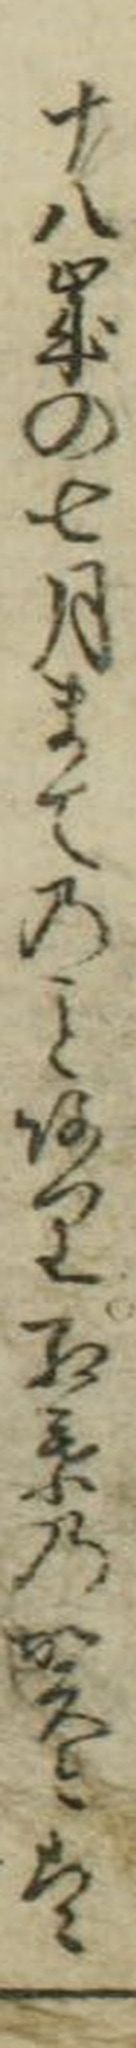十八歳の七月まてのことあり。紅葉の賀とは
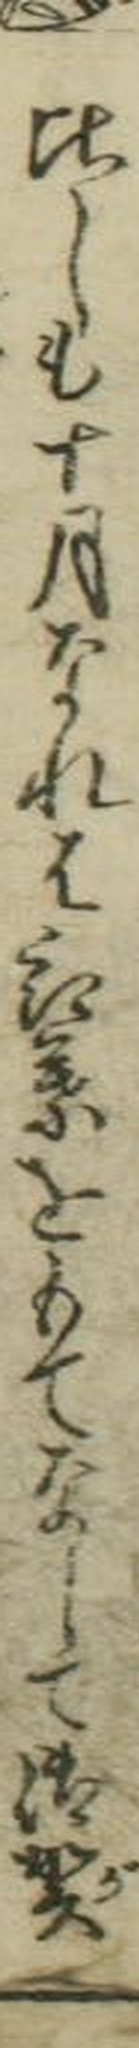比しも十月なれは紅葉をもてなして御賀
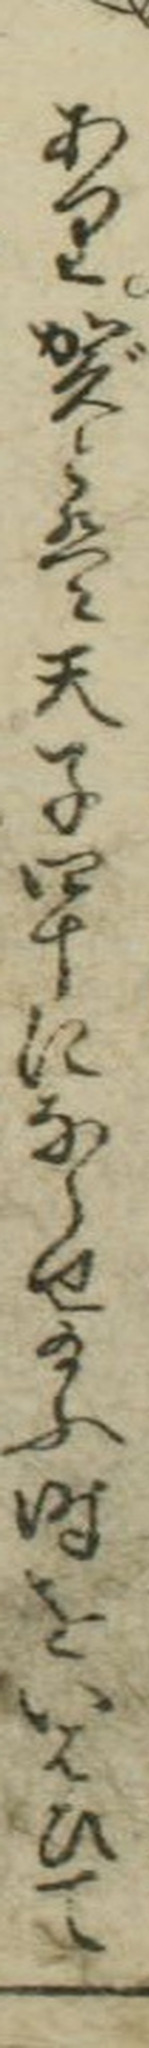あり。賀とは天子四十にならせ給ふ時をいはひて
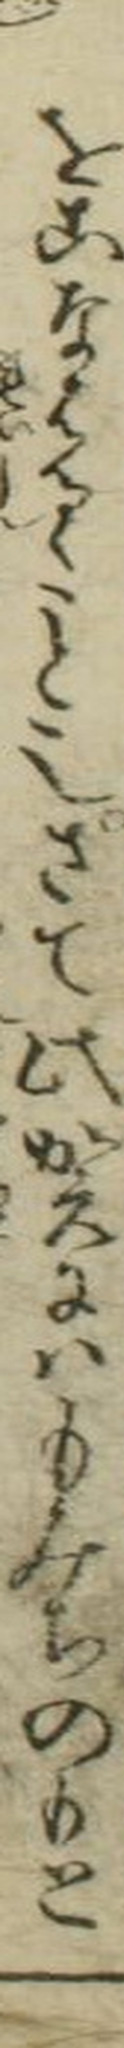をこなはるゝこと也。さて此賀にはもみちのもと
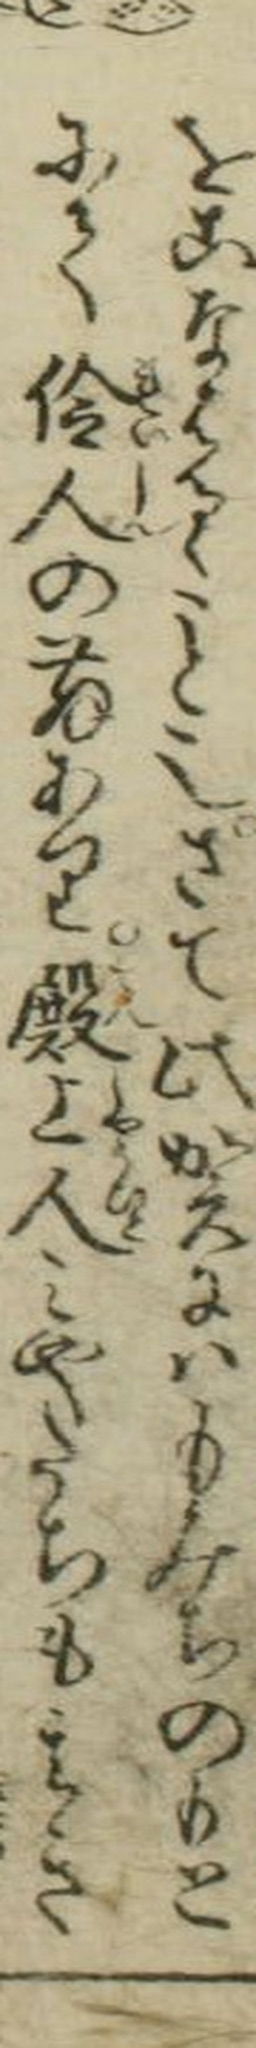にて伶人の舞あり。殿上人みやたちも其き
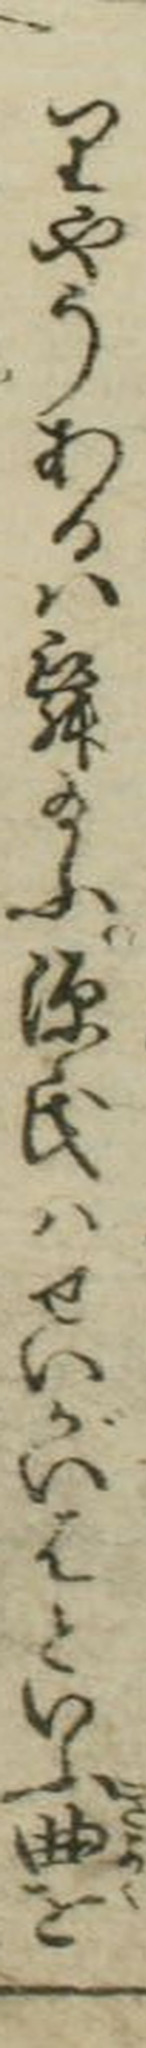りやうあるは舞給ふ。源氏はせいがいはといふ曲を
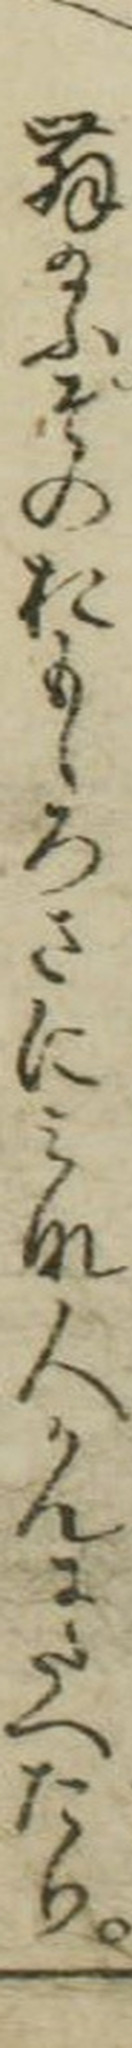舞給ふ。そのおもしろさにみな人かんにたへたり。
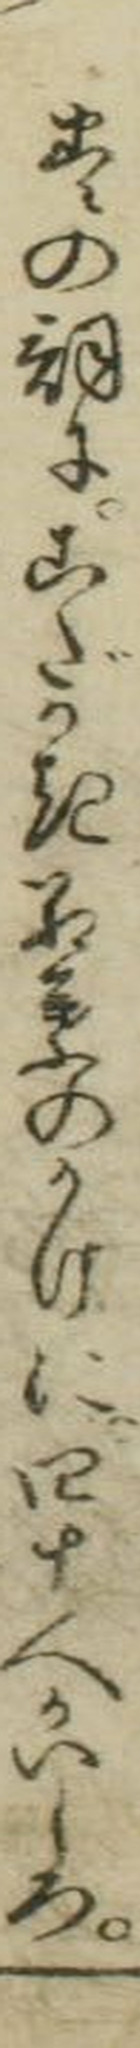巻の詞に。こだかき紅葉のかけに四十人かいしろ。
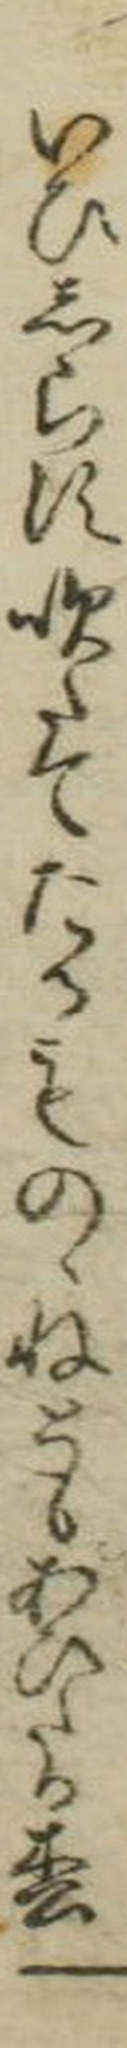いひしらす吹たてたるものゝねともあひたる松
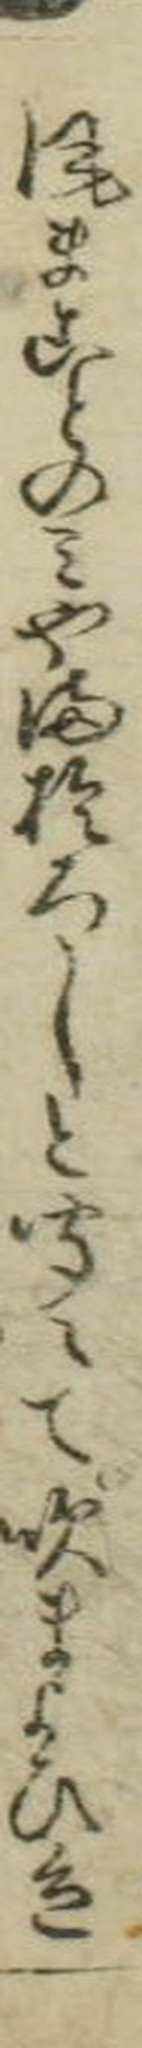風まことのみやまおろしと聞えて。吹まよひ辺
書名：女源氏教訓鑑
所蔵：東京学芸大学附属図書館
